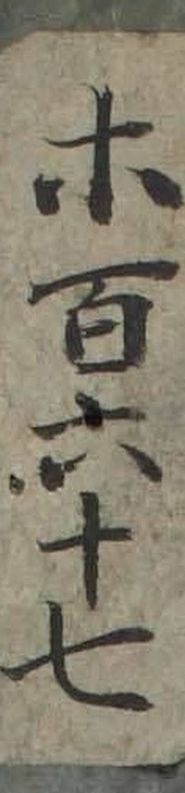ホ百六十七
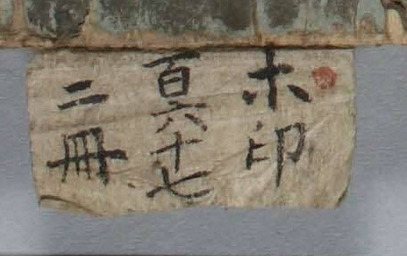三五五
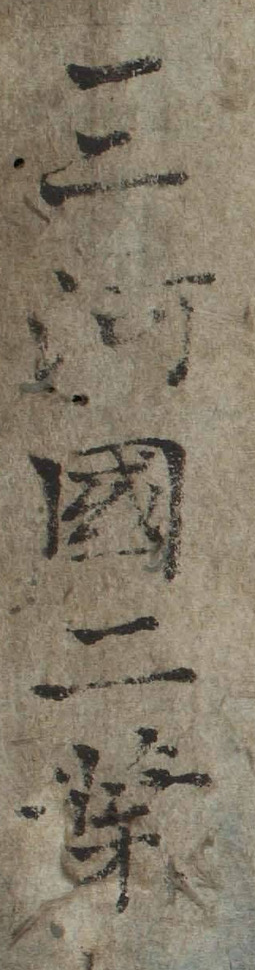三河国二葉

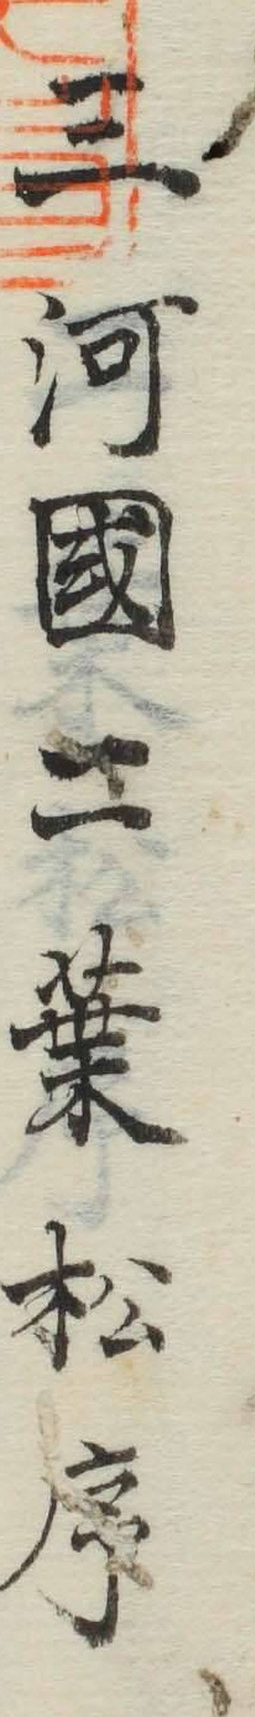三河國二葉松序
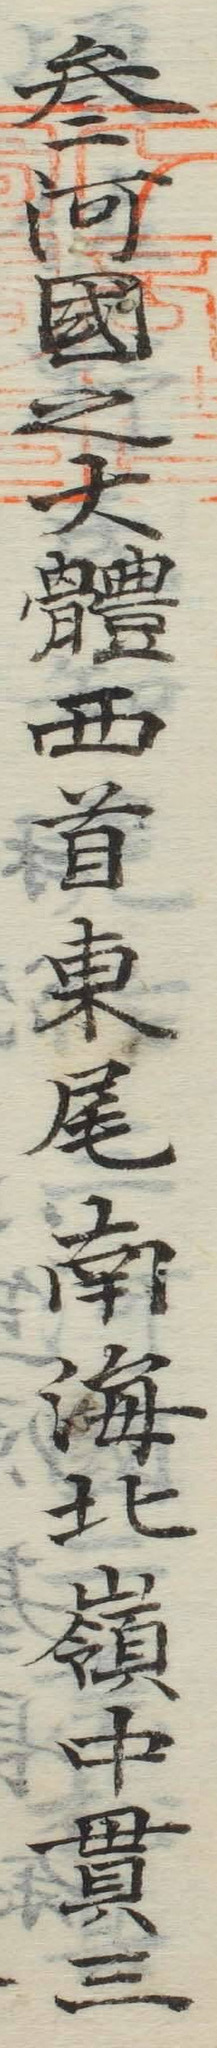参河国之大體西首東尾南海北嶺中貫三
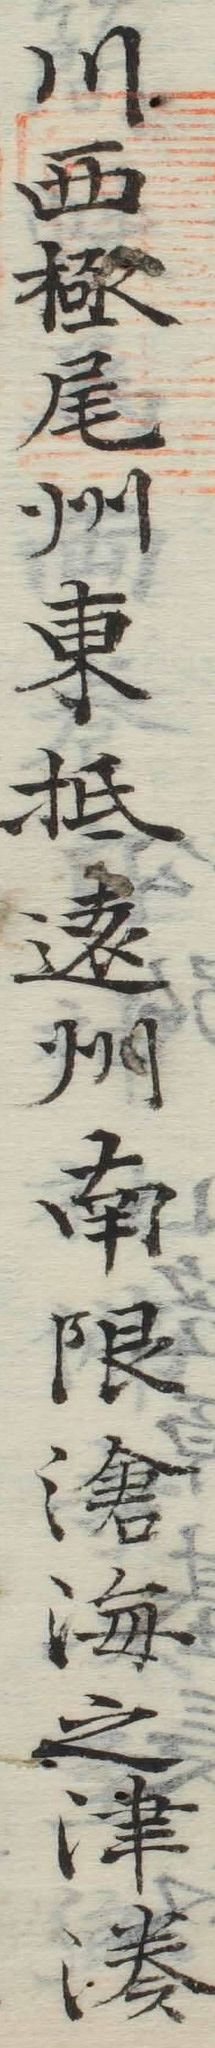川西極尾州東抵遠州南限滄海之津湊
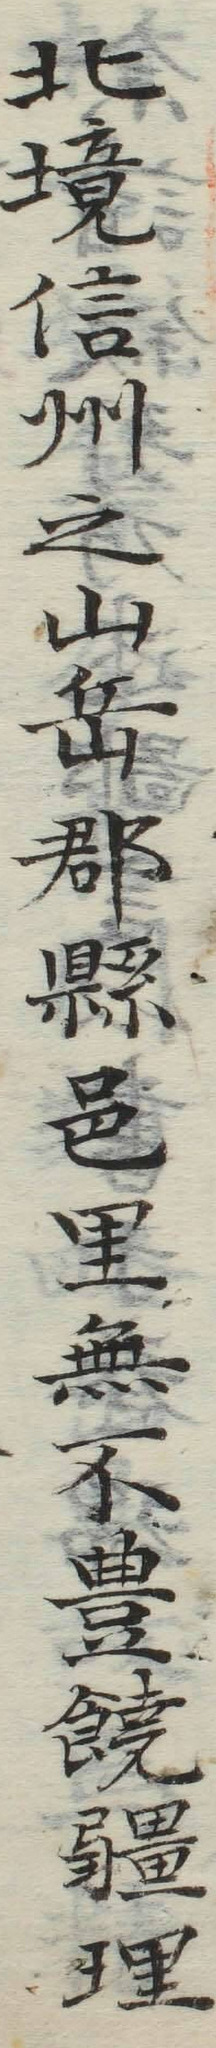北境信州之山岳郡縣邑里無不豊饒疆理
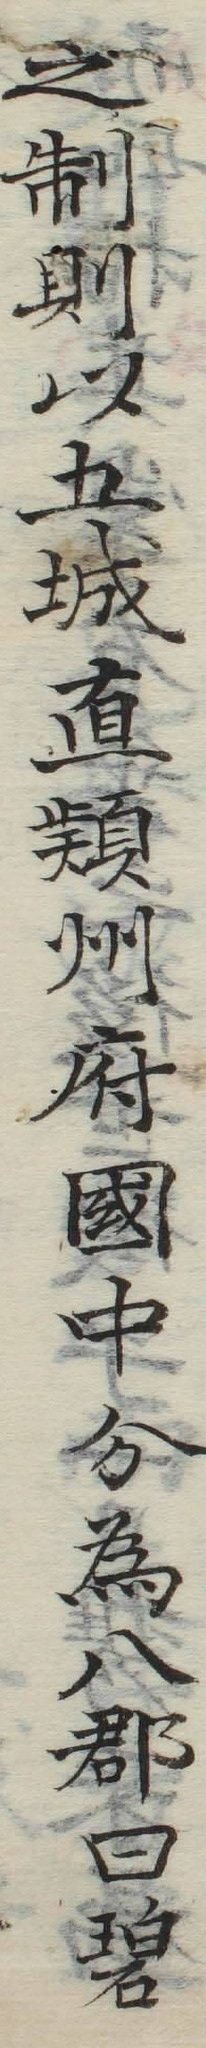之制則以五城直類州府國中分為八郡曰碧
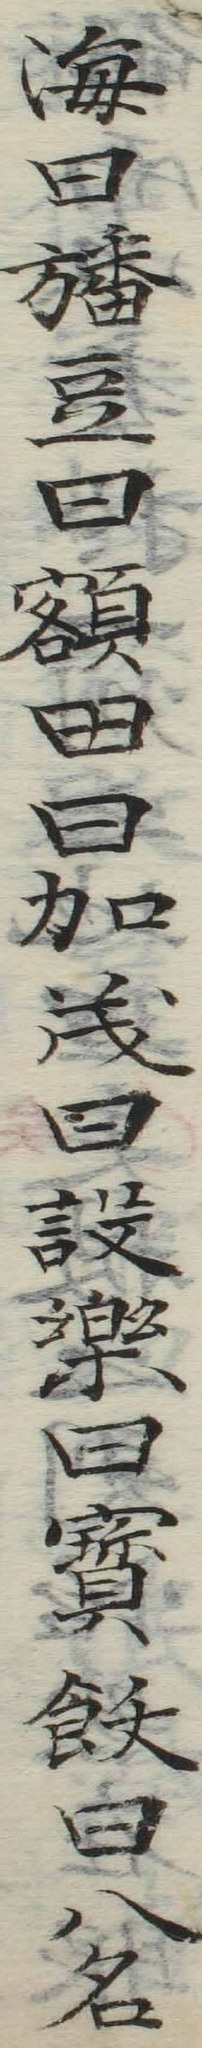海曰旙豆曰額田曰加茂曰設樂曰寳飫曰八名
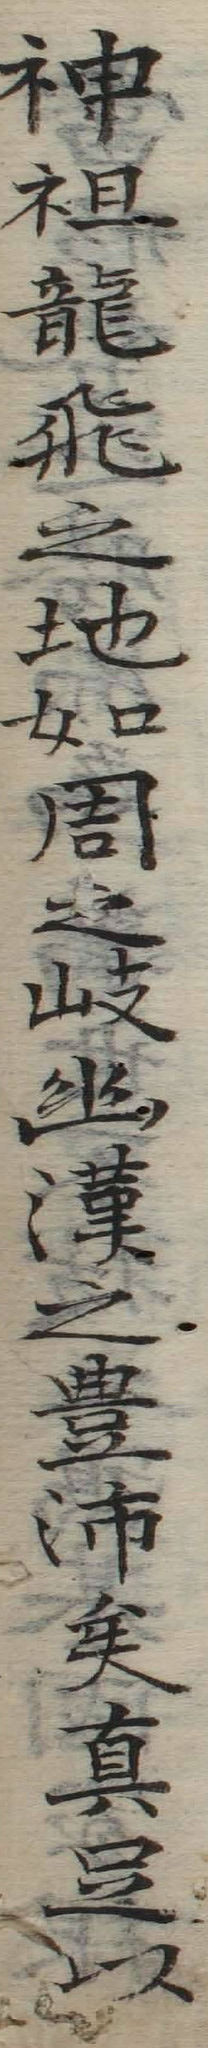神祖龍飛之地如周之岐幽漢之豊沛矣真以

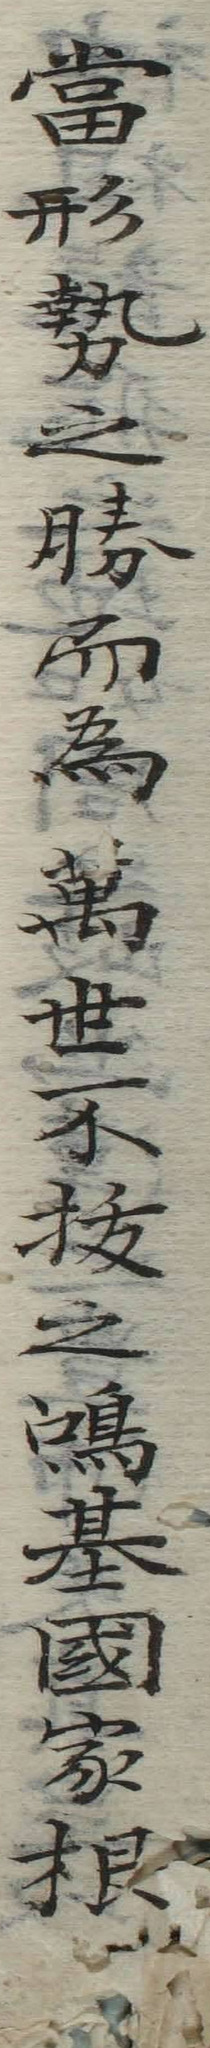當形勢之勝而為萬世不抜之鴻基國家根
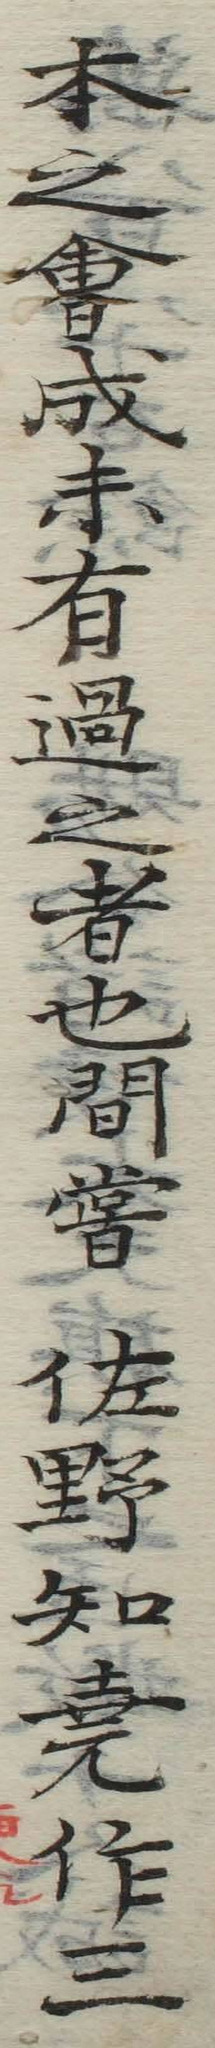本之會成未有過之者也間嘗佐野知堯作三
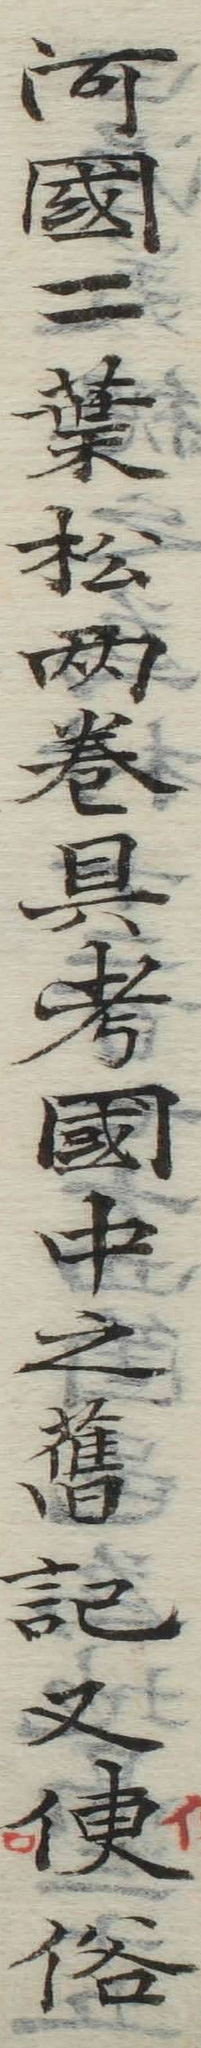河國二葉松兩巻具考國中之舊記又便俗
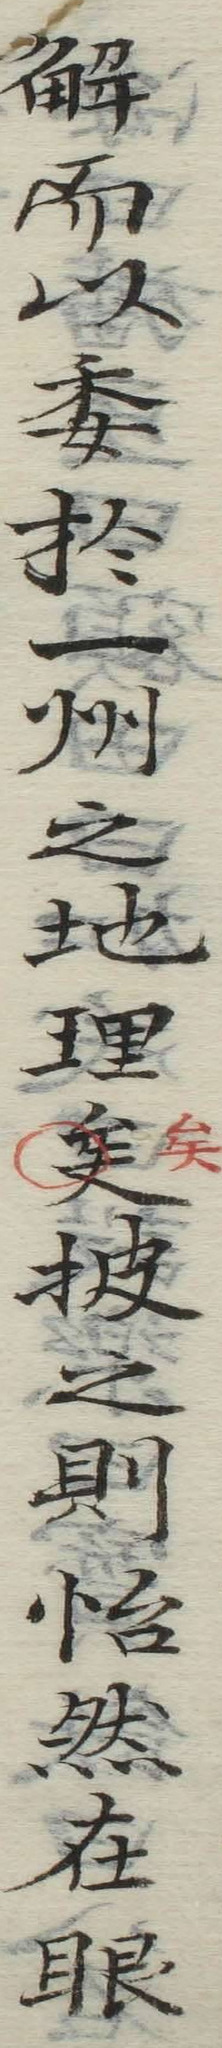解而以委於一州之地理矣披之則怡然在眼
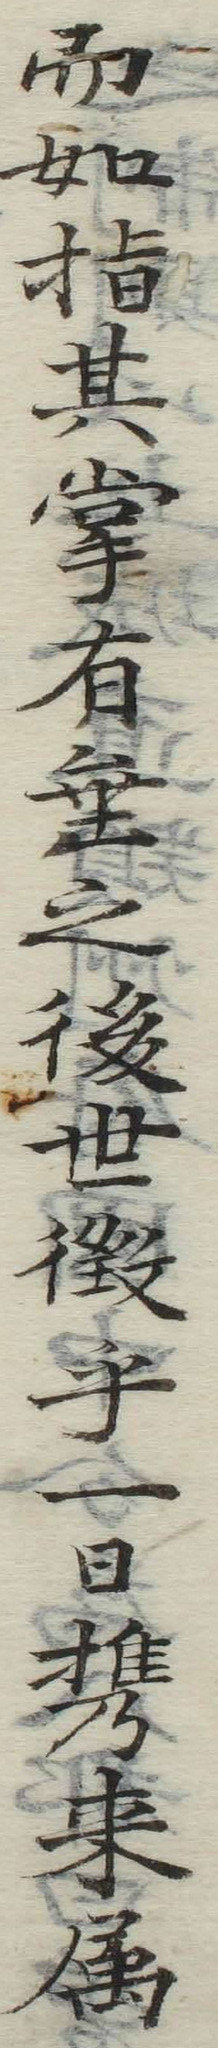而如指其掌有垂之後世徴乎一日携来属
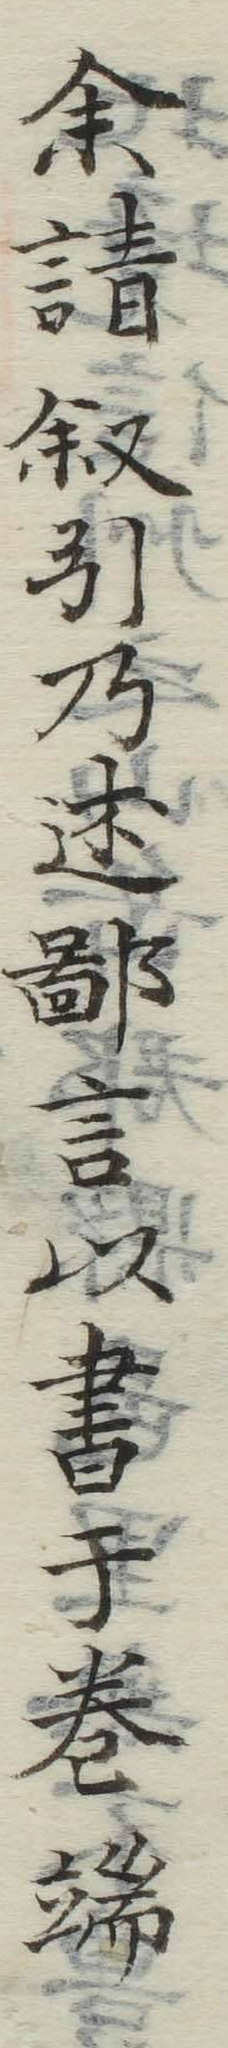余請叙引端乃述鄙言以書于巻端
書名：三河国二葉松
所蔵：国文学研究資料館
